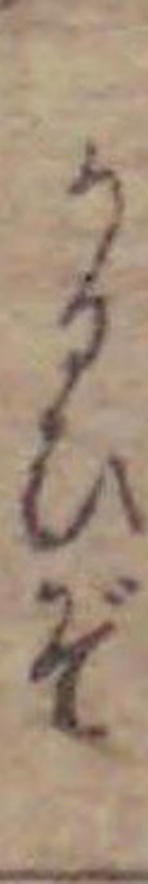かるひぞ

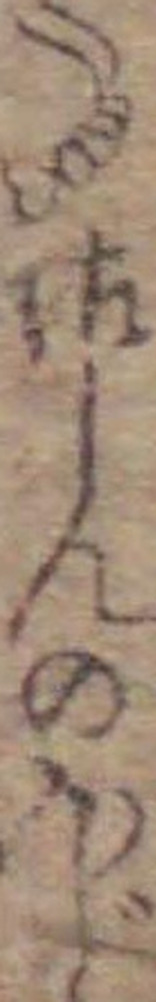御しんのほど
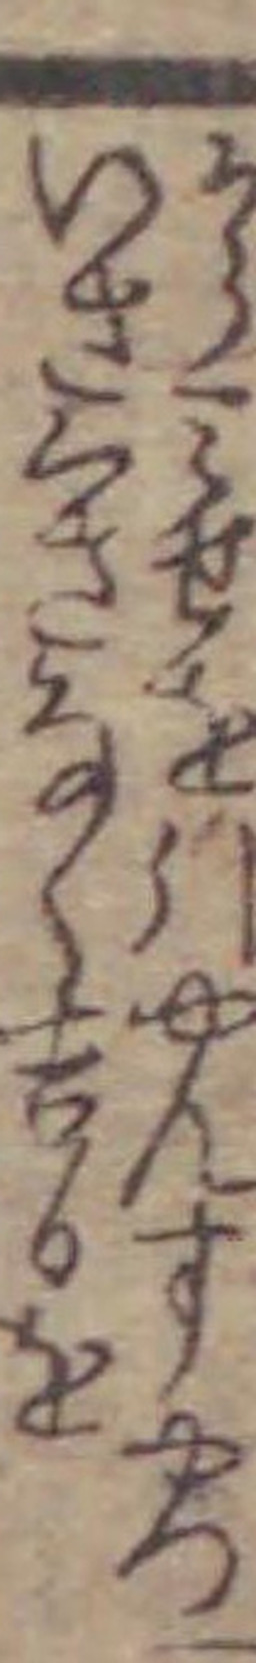いさくさなく吉日を
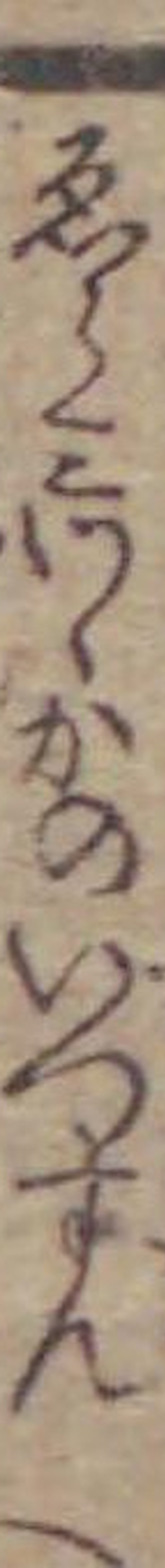えらみつゝかのいつすん
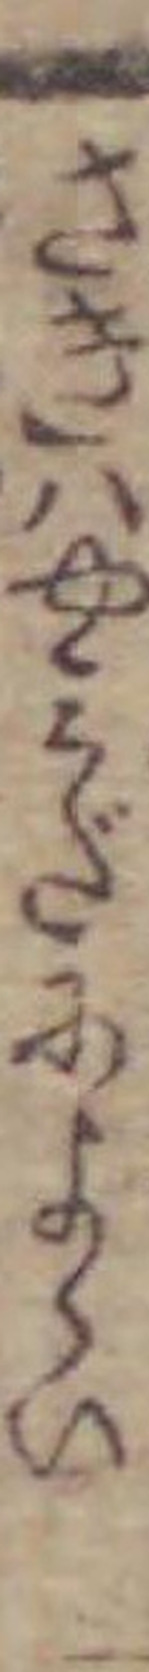さきはやみだによらい
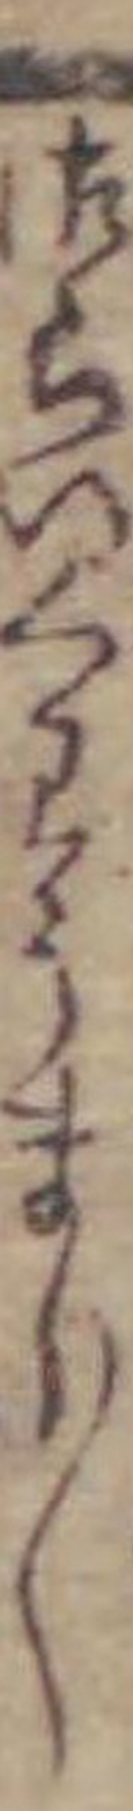御らいくわうまし〳〵
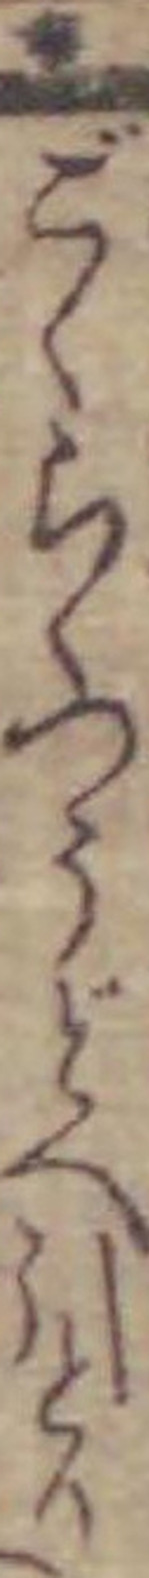ごくらくつうどへ引とり
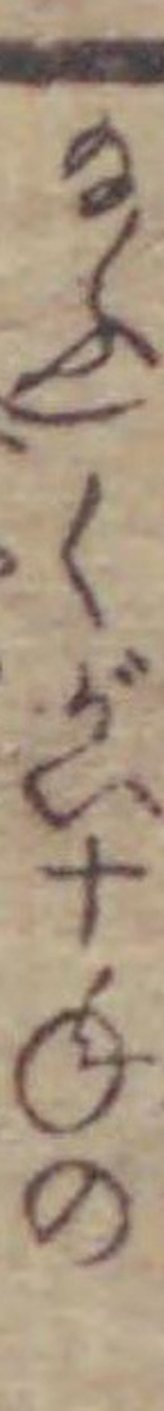給ふくがい十年の
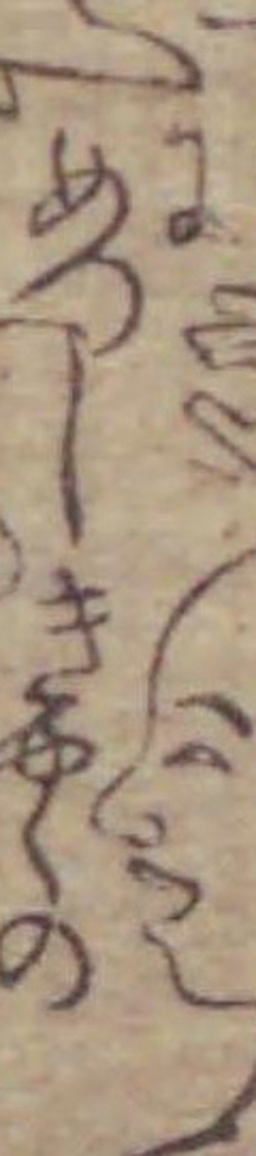めつしきやくの
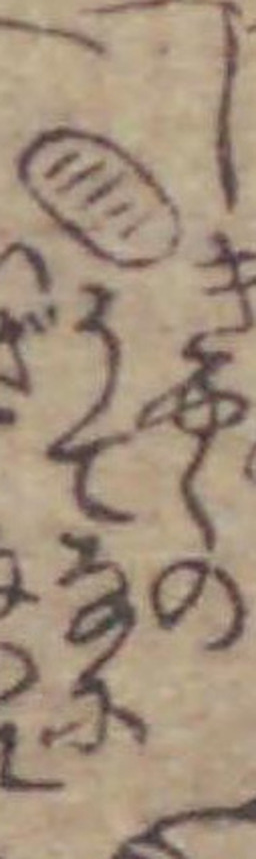うてなに
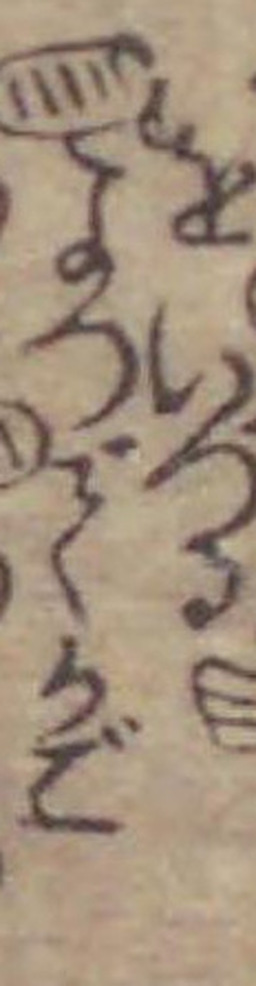よつでかご
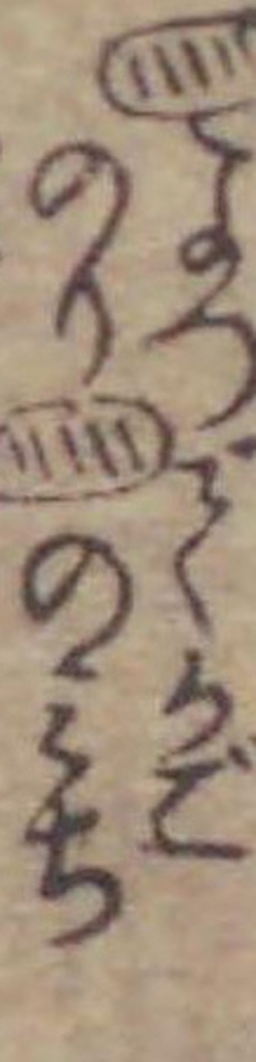のりのみち
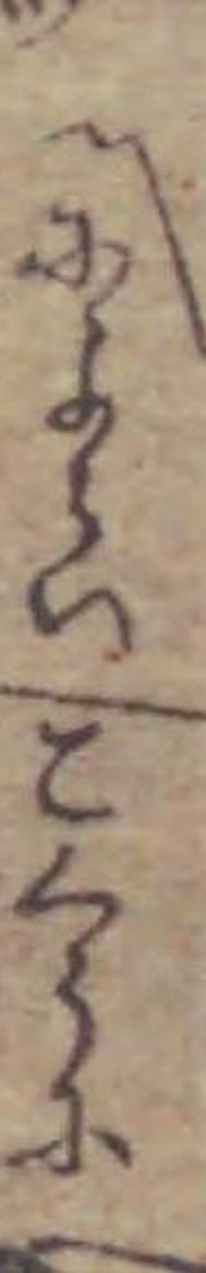「によらいこくうに
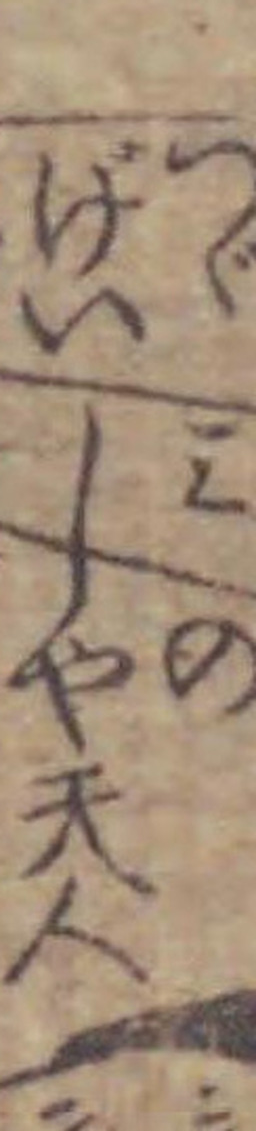げいしや天人
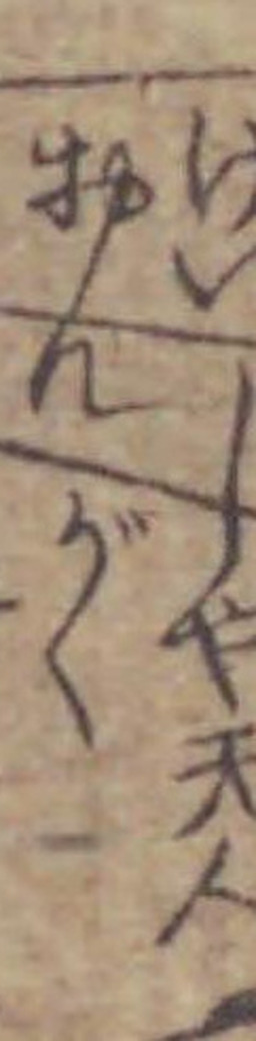おんがく
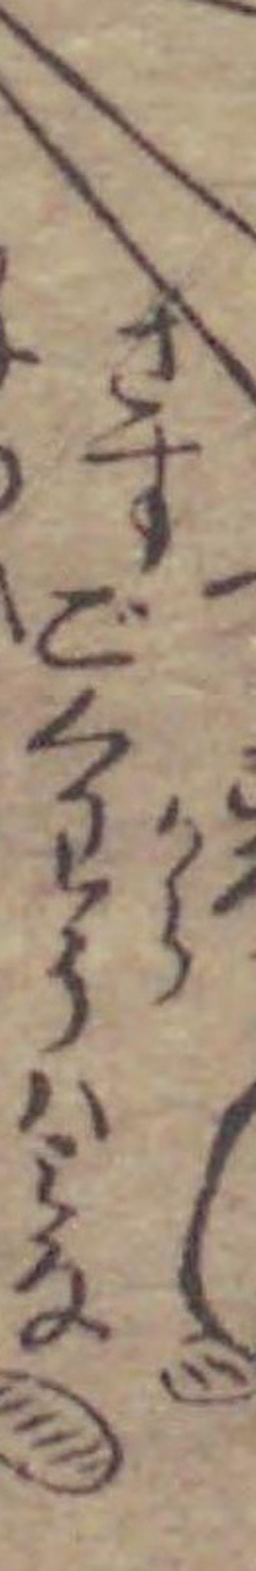ごくわうはみな
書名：九替十年色地獄 : 3巻
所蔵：国立国会図書館 National Diet Library, JAPAN
